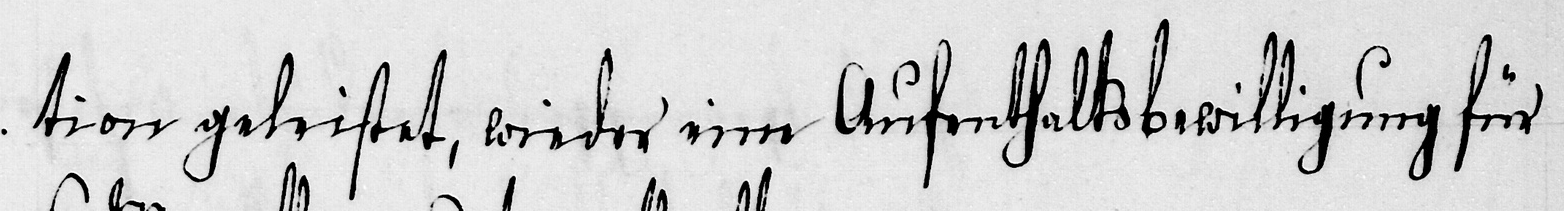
tion geleistet, wieder eine Aufenthaltsbewilligung für
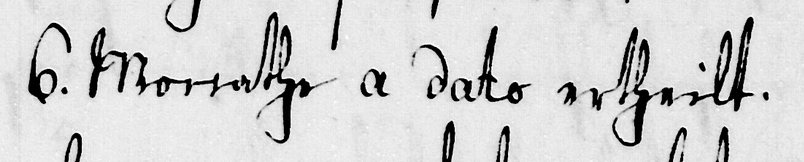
6. Monathe a dato ertheilt.
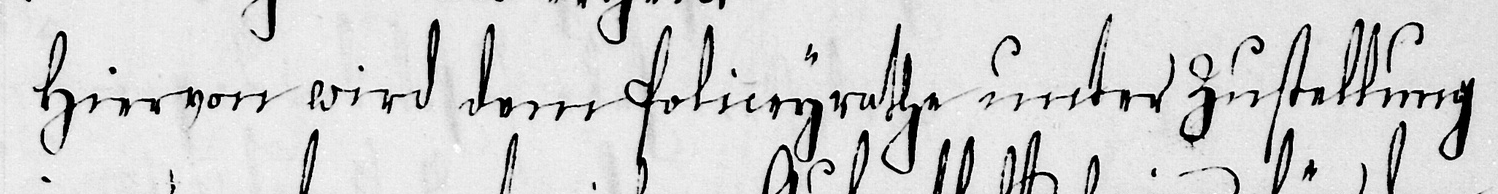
Hiervon wird dem Policeyrathe unter Zustellung
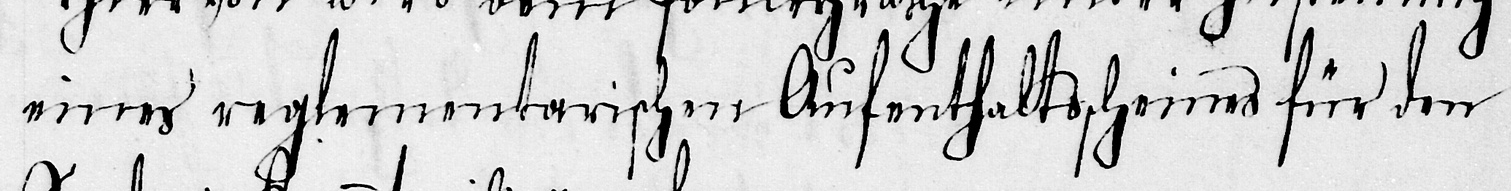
eines reglementarischen Aufenthaltsscheines für den
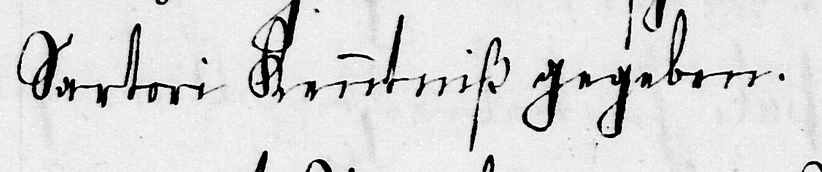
Sartori Kenntniß gegeben.
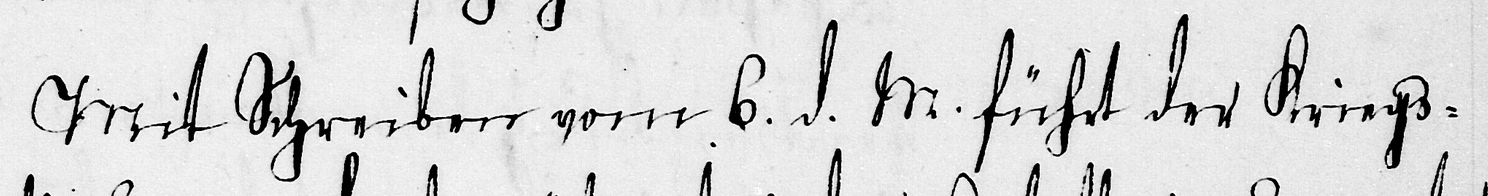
Mit Schreiben vom 6. d. M. führt der Kriegs¬
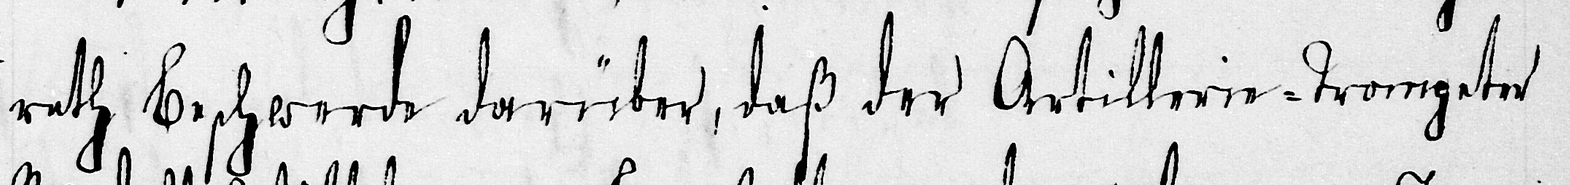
rath Beschwerde darüber, daß der Artillerie-Trompeter
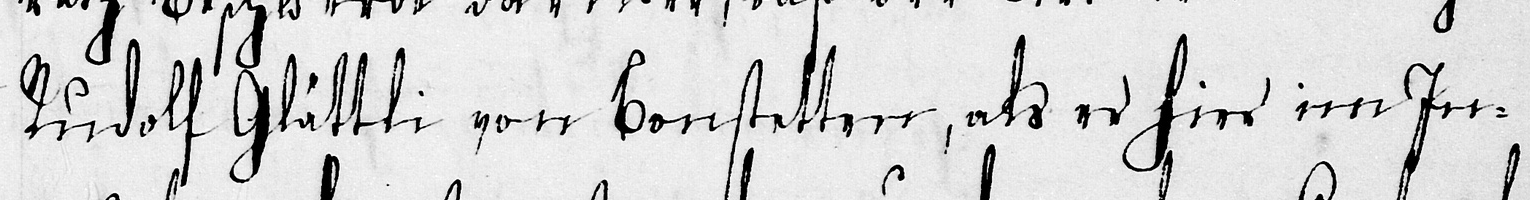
Rudolf Glättli von Bonstetten, als er hier im In¬
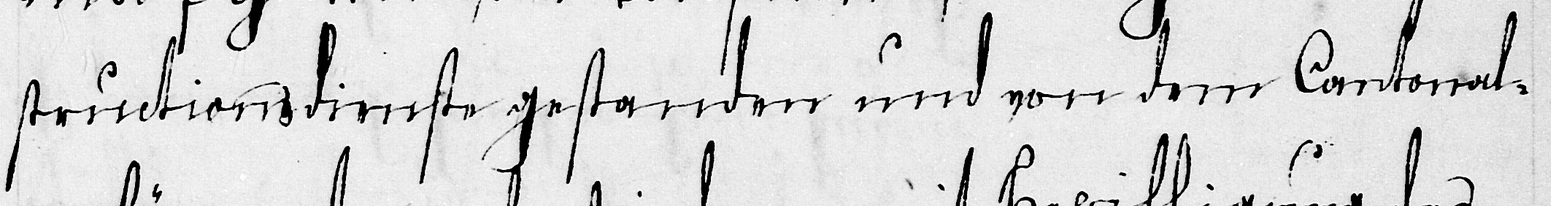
structionsdienste gestanden und von dem Cantonal¬
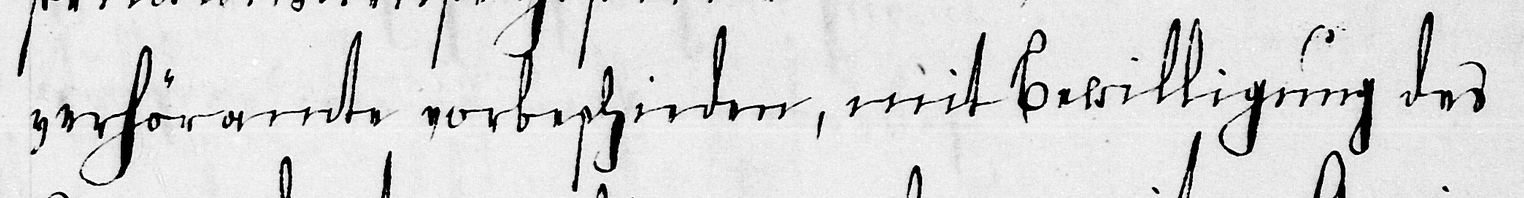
verhöramte vorbeschieden, mit Bewilligung des
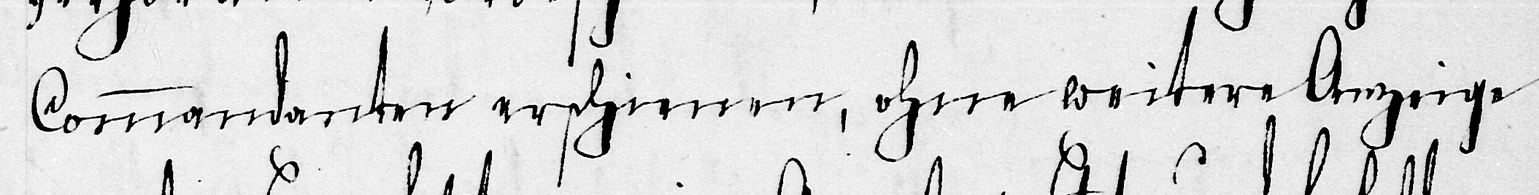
Commandanten erschienen, ohne weitere Anzeige
